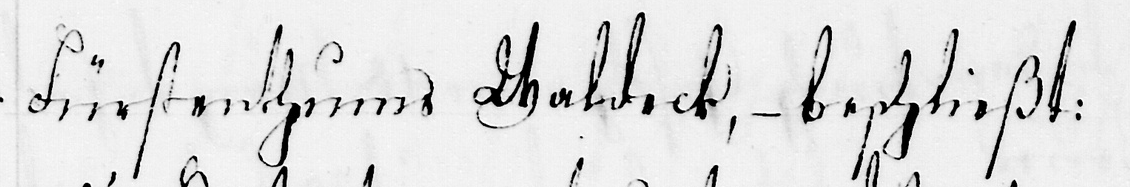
Fürstenthums Waldeck, – beschließt:
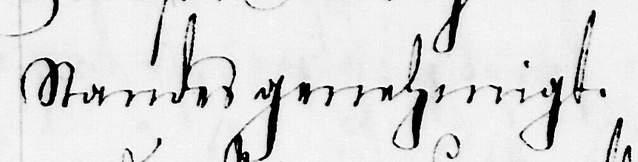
Standes genehmigt.
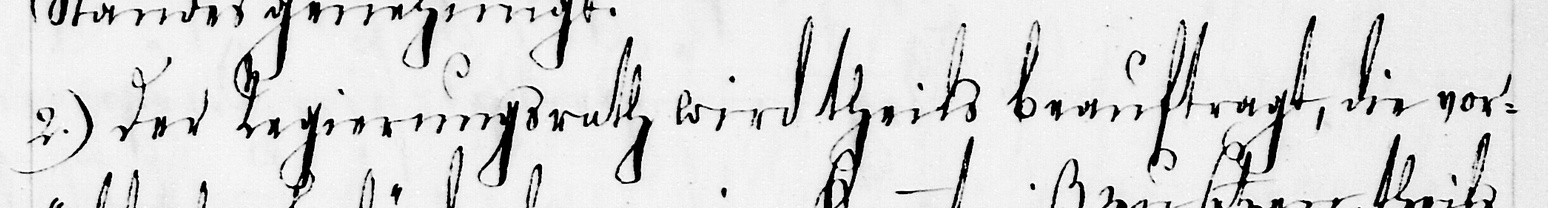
2.) Der Regierungsrath wird theils beauftragt, die vor¬
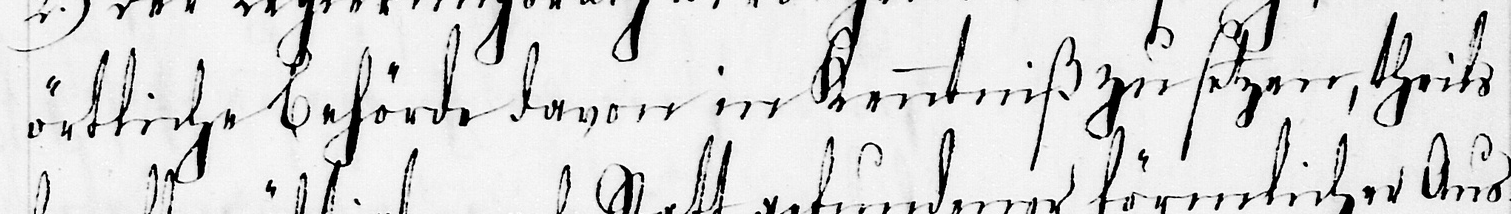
örtliche Behörde davon in Kenntniß zu setzen, theils
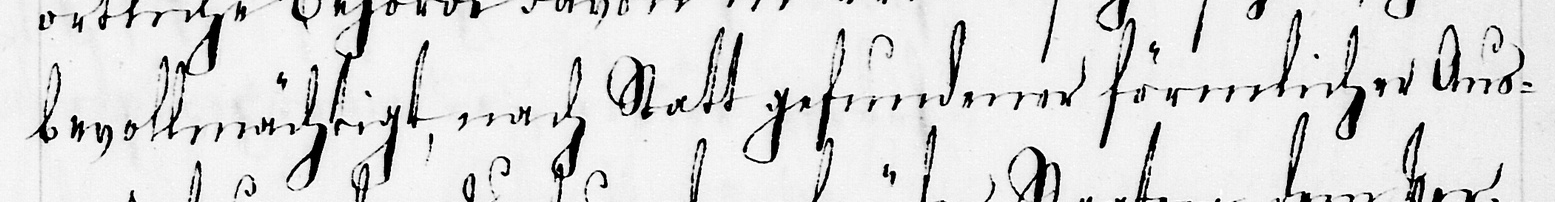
bevollmächtigt, nach Statt gefundener förmlicher Aus¬
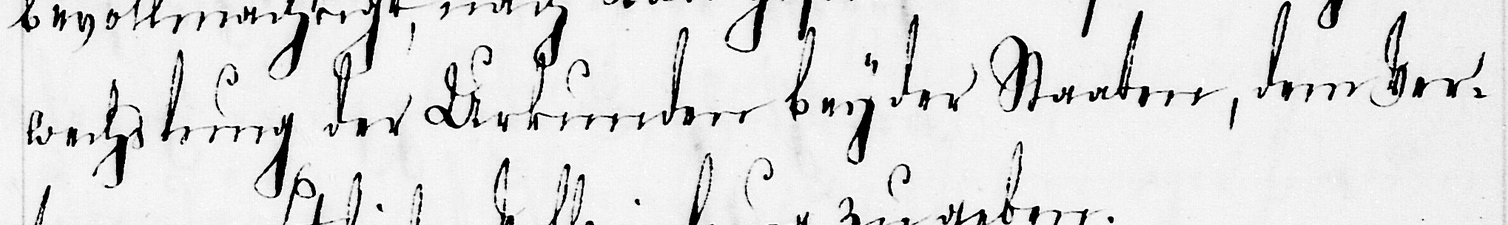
wechslung der Urkunden beyder Staaten, dem Ver¬
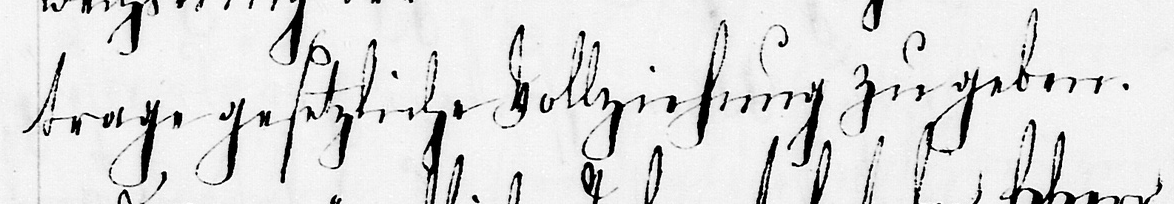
trage gesetzliche Vollziehung zu geben.
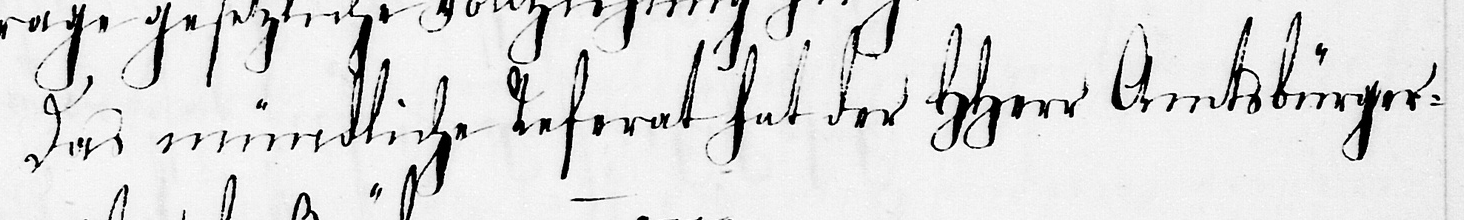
Das mündliche Referat hat der HHerr Amtsbürger¬
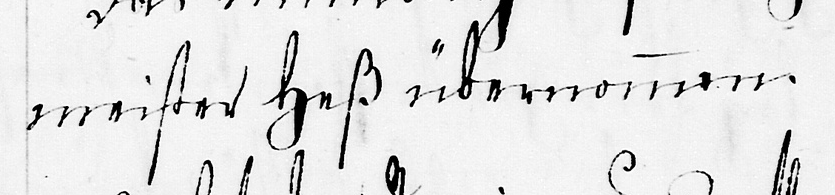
meister Heß übernommen.
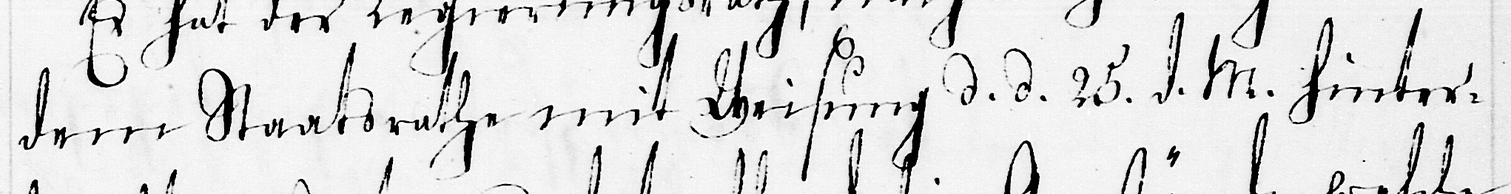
dem Staatsrathe mit Weisung d. d. 25. d. M. hinter¬
